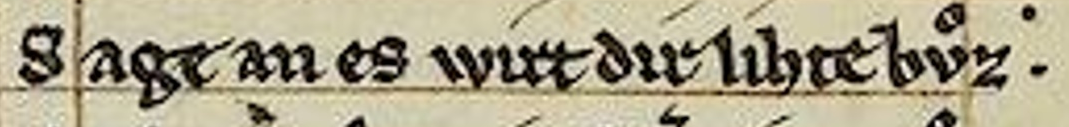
Sage an es wirt dir lihte bv°oz.
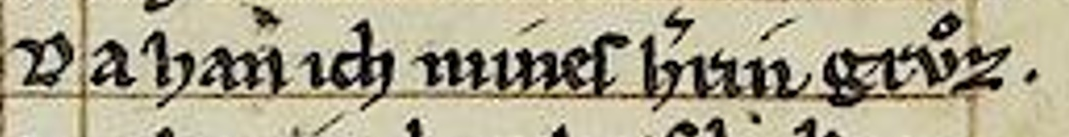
Da han ich mineſ h(er)rin grv°oz.
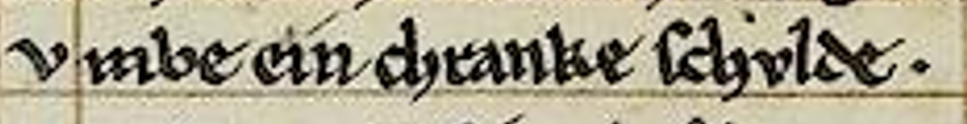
Vmbe ein chranke ſchvlde.
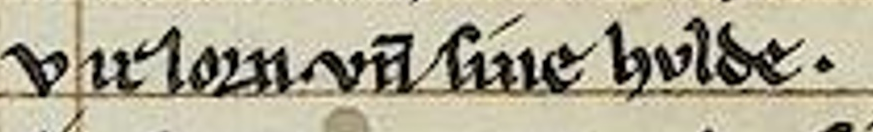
Virlorn vn(d) ſine hvlde.
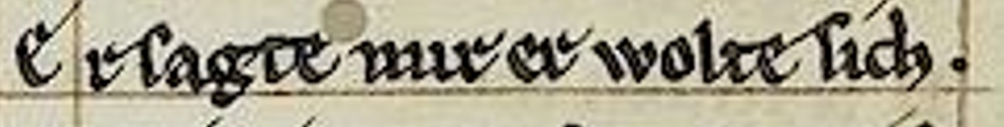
Er ſagte mir er wolte ſich.
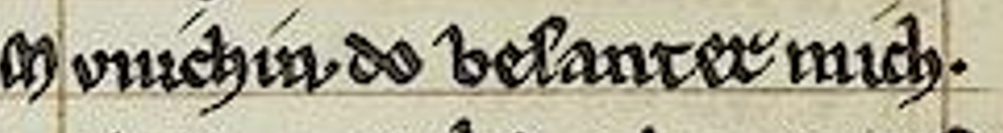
Mvnichin do beſanter mich.
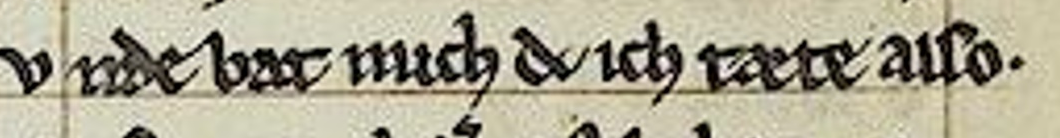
Vnde bat mich d(az) ich t[ae]te alſo.
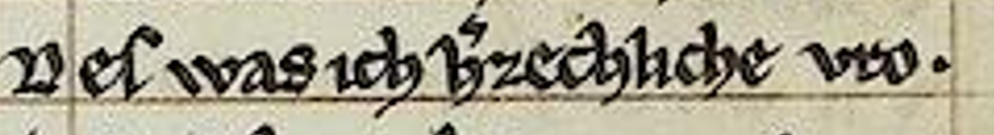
Deſ was ich h(er)zechliche vro.
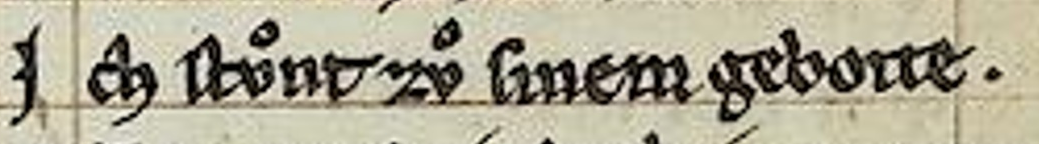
Ich ſtv°ont zv°o ſinem gebotte.
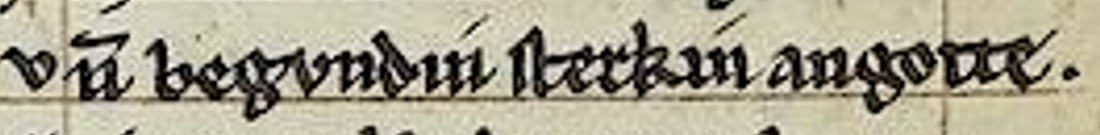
Vn(d) begvndin ſterkin angotte.
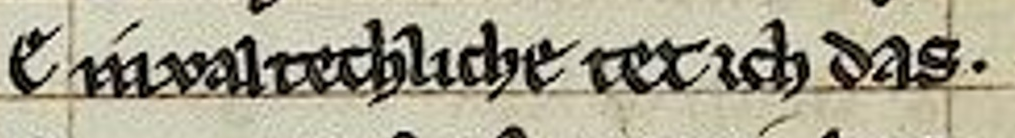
Einvaltechliche tet ich das.
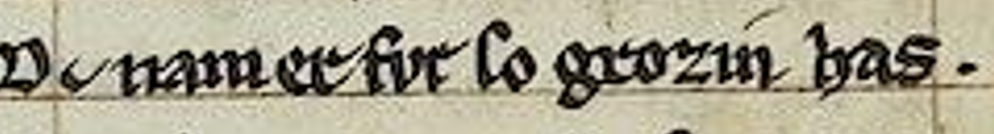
D(az) nam er fvr ſo grozin has.
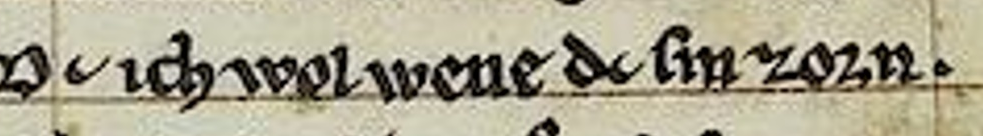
D(az) ich wol wene d(az) ſin zorn.
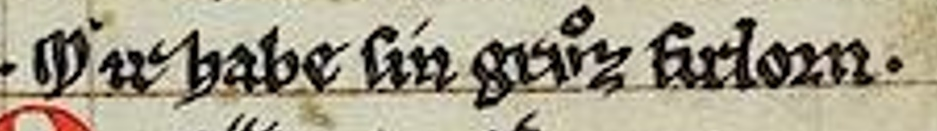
Mir habe ſin grv°oz firlorn.
